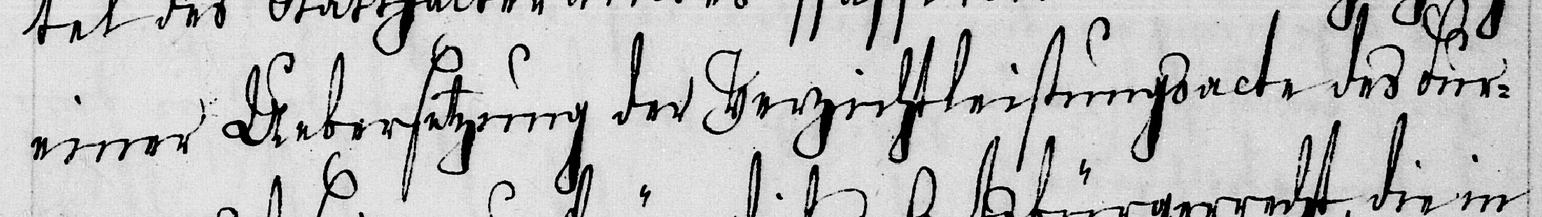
einer Uebersetzung der Verzichtleistungsacte des Fur¬
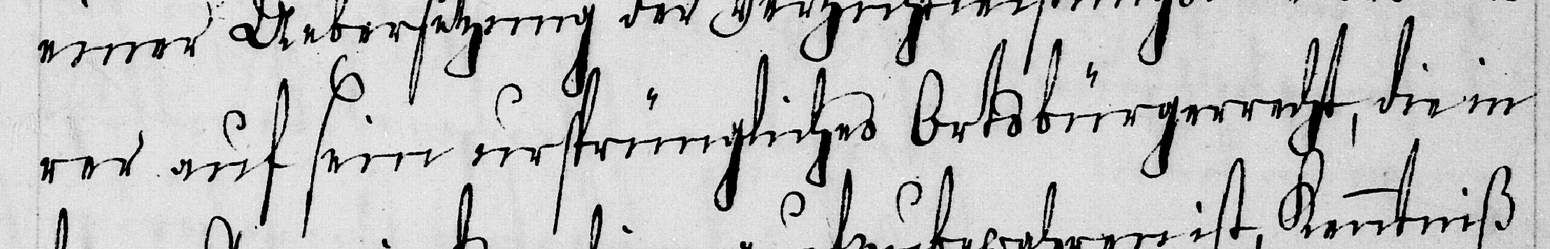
rer auf sein ursprüngliches Ortsbürgerrecht, die in
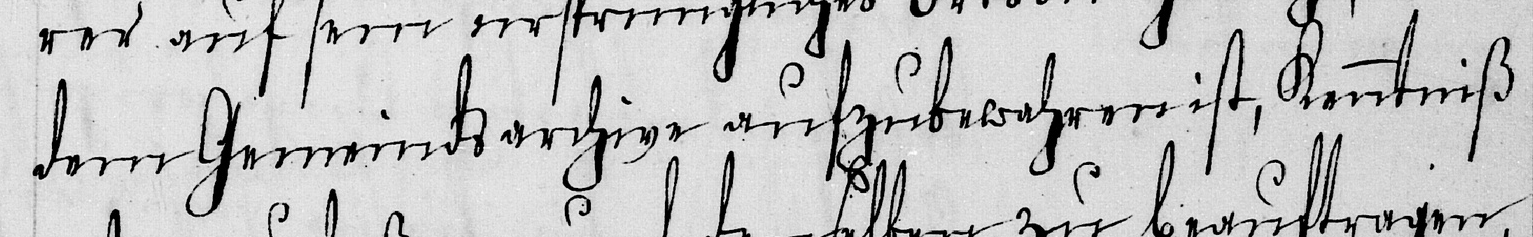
dem Gemeindsarchive aufzubewahren ist, Kenntniß
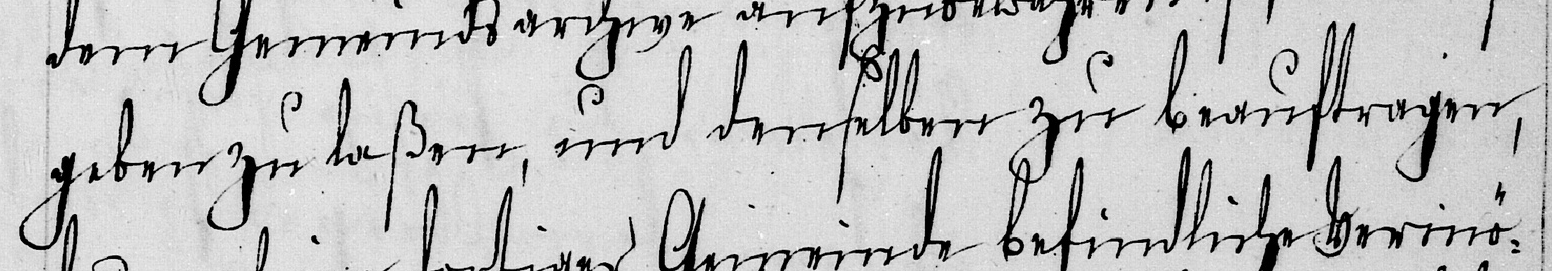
geben zu laßen, und denselben zu beauftragen,
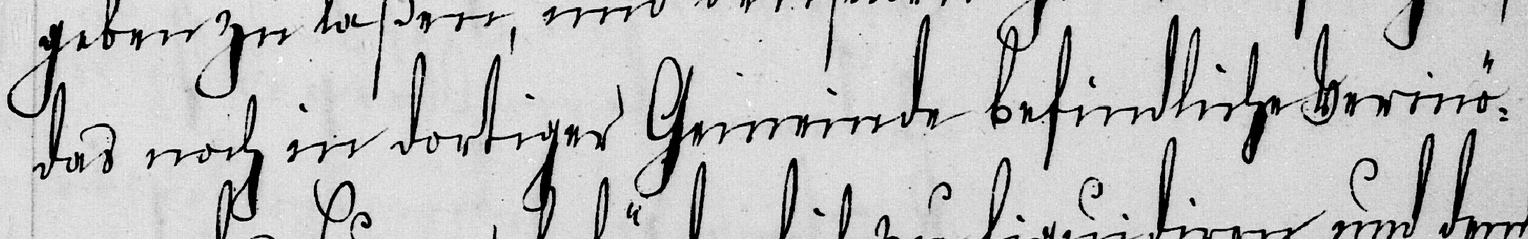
das noch in dortiger Gemeinde befindliche Vermö¬
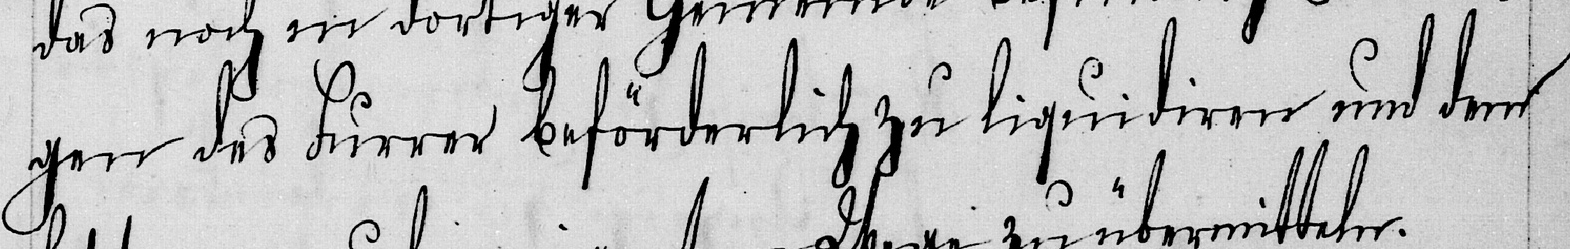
gen des Furrer beförderlich zu liquidiren und dem
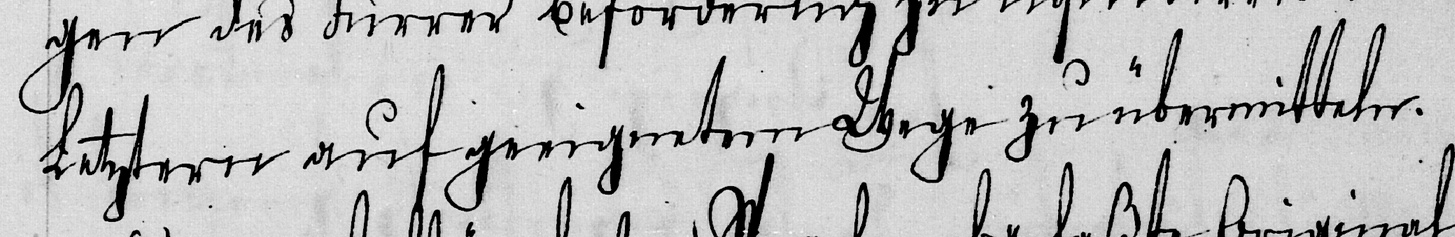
Letztern auf geeignetem Wege zu übermitteln.
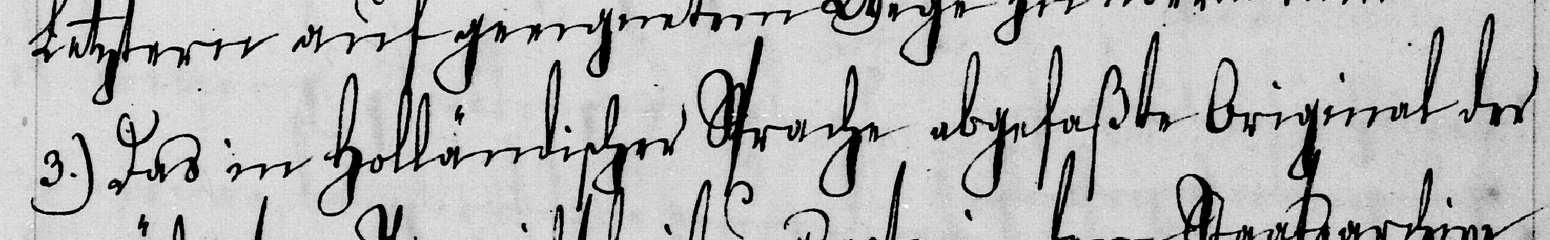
3.) Das in Holländischer Sprache abgefaßte Original der
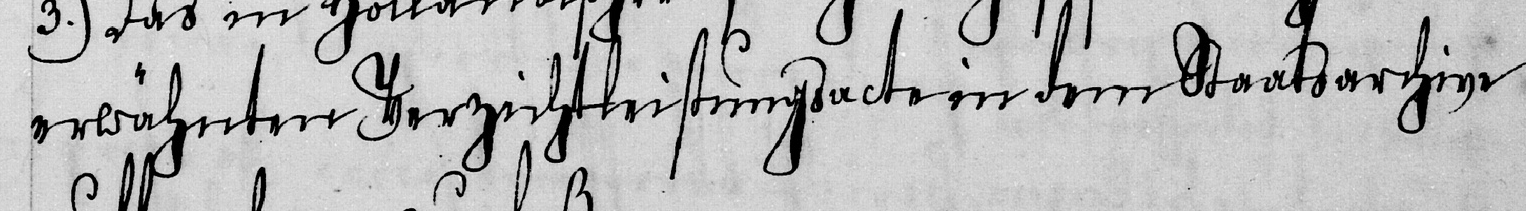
erwähnten Verzichtleistungsacte in dem Staatsachive
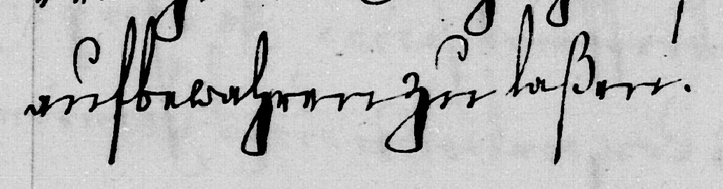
aufbewahren zu laßen.
